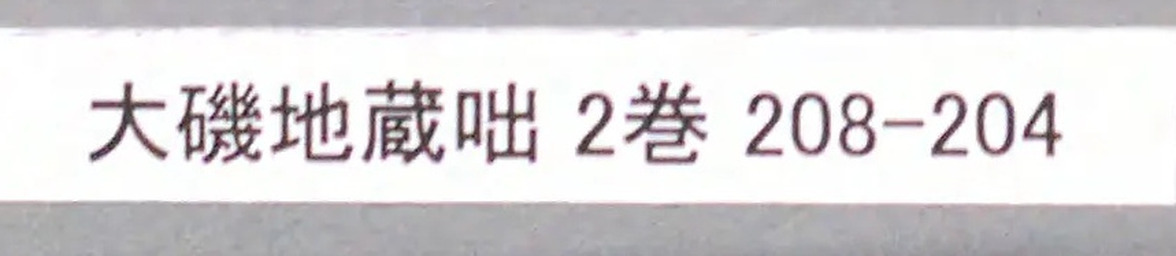大磯地蔵咄全
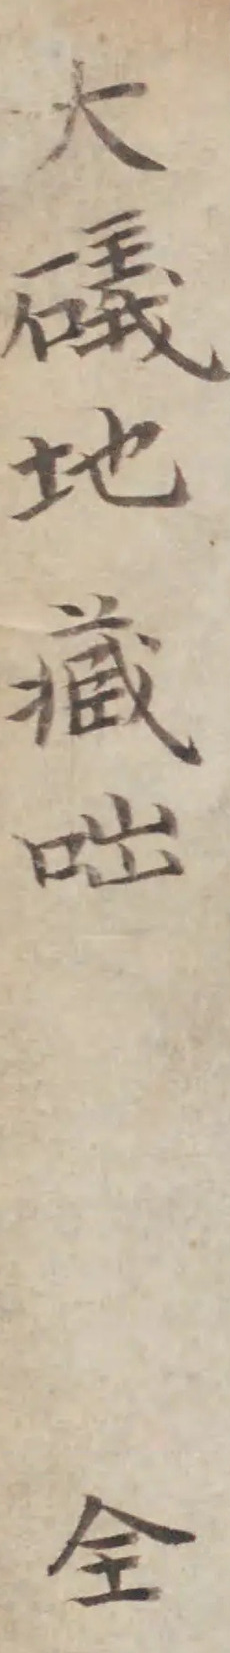大磯地蔵咄全

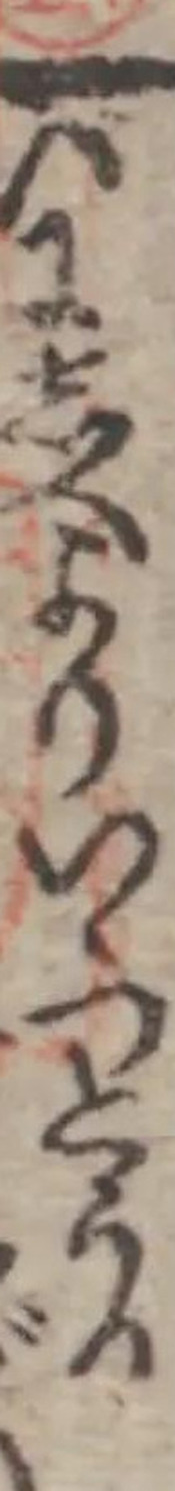いにしへよりいゝつとうか
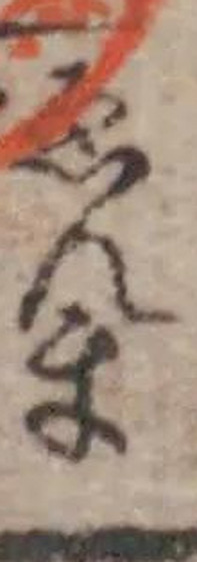ゑんま
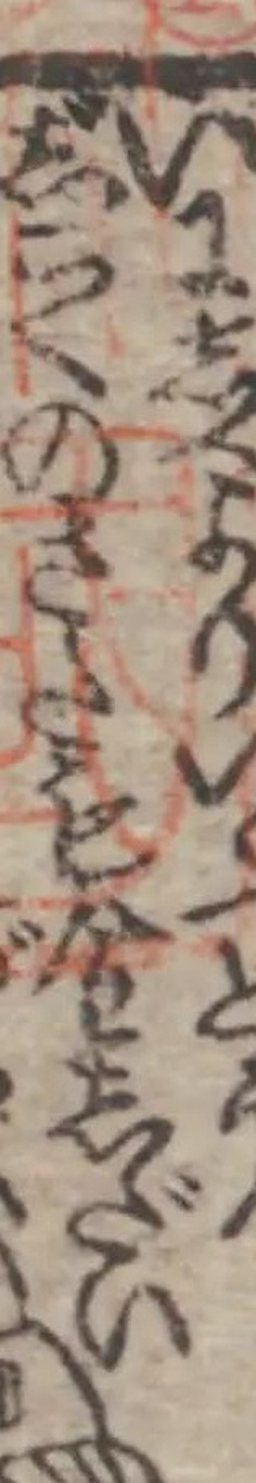じこくのさたも金しだい
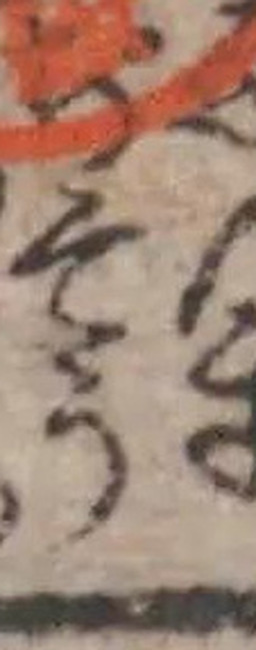ぢそう
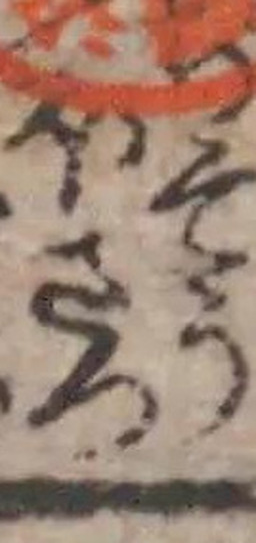ほさつ
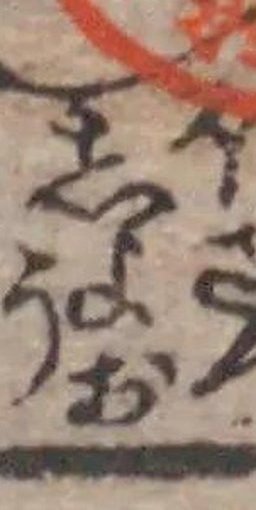しよお
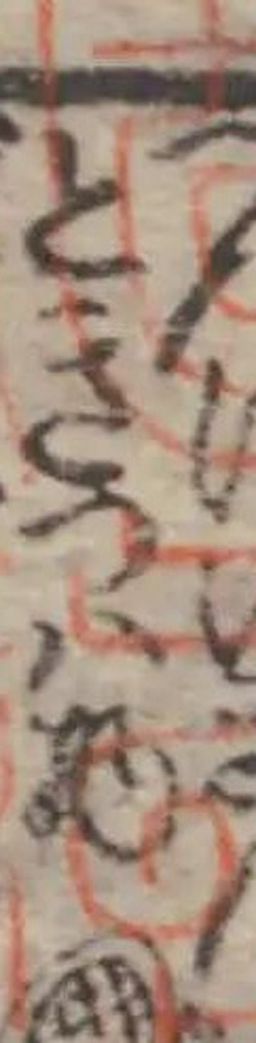ときつは物
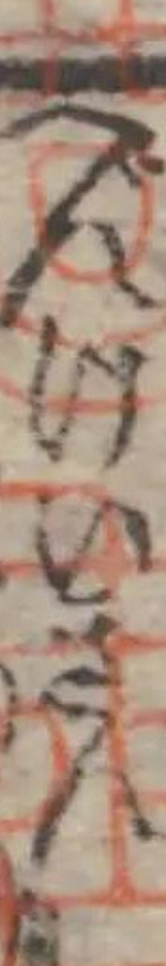べんけいきん
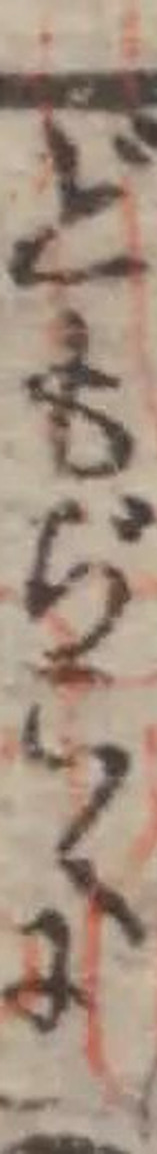どもぢこくに
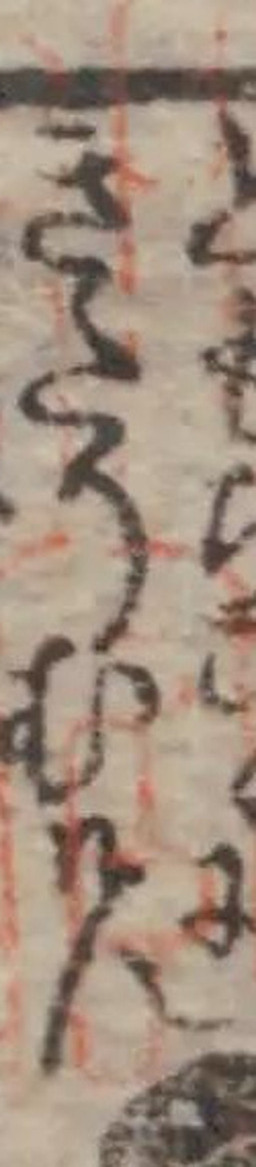きたりむけん
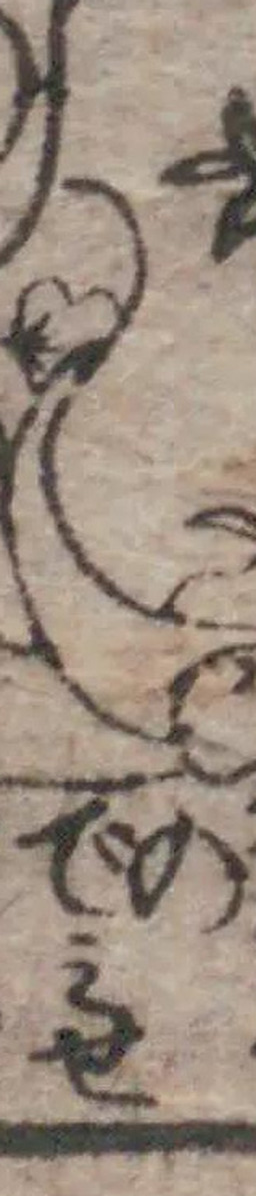でみせ
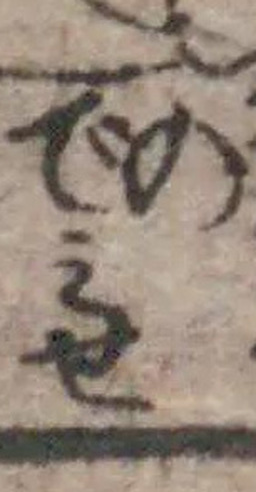でみせ
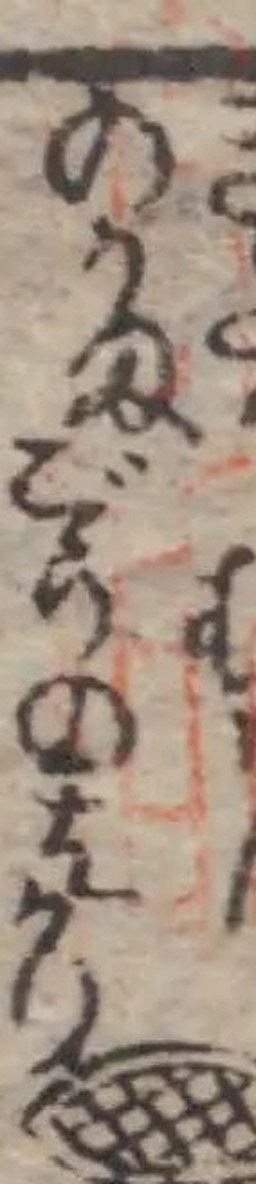のかまごうのはかり
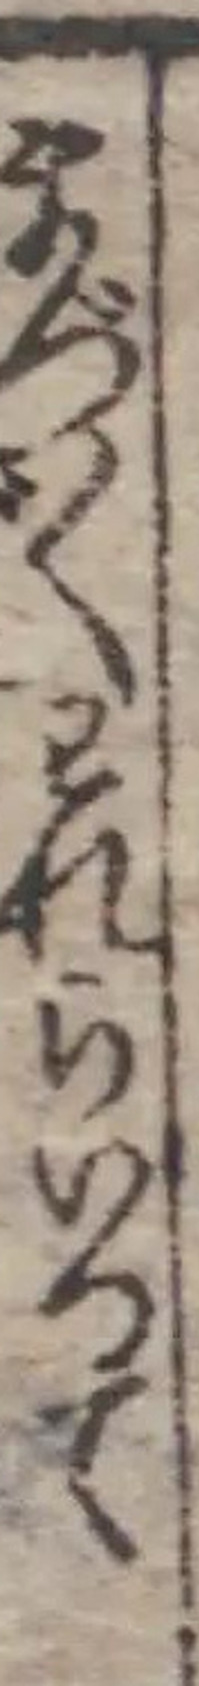まづ〳〵われらいつて
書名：大磯地蔵咄 2巻
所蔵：国立国会図書館 National Diet Library, JAPAN
